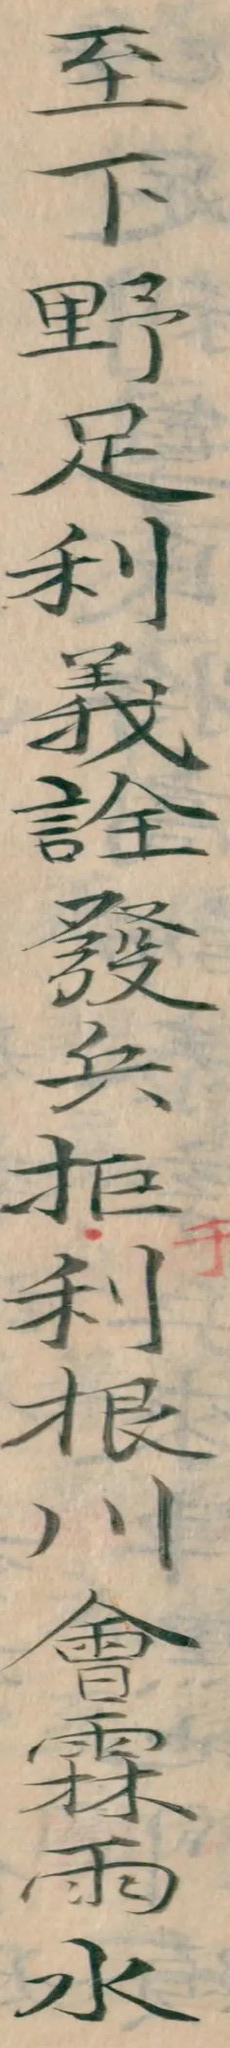至下野足利義詮発兵拒于利根川会霖雨水
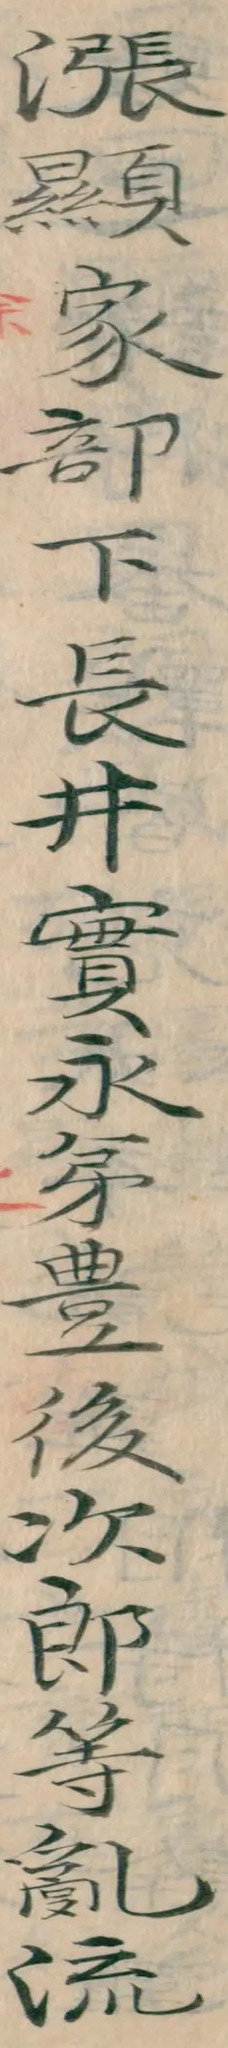漲顕家部下長井実永弟豊後次郎等乱流
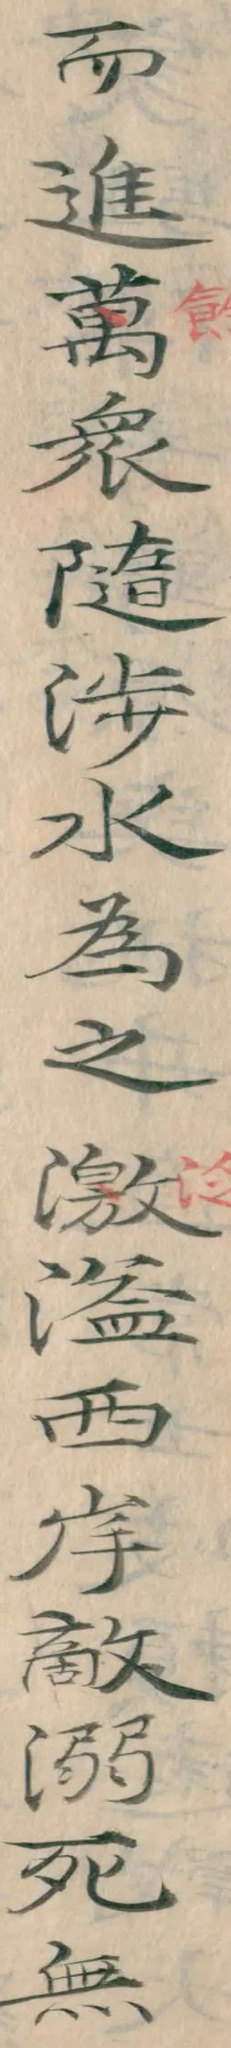而進万余衆隨渉水為之激泛溢西岸敵溺死無
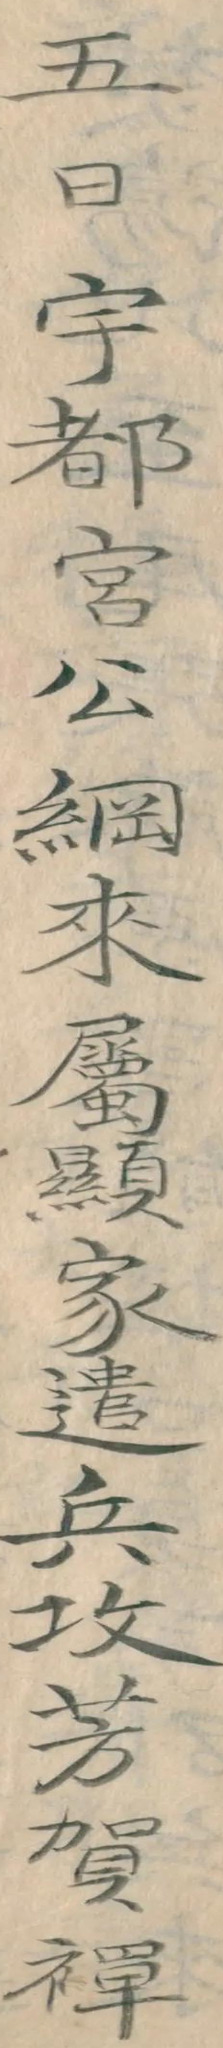五日宇都宮公綱来属顕家遣兵攻芳賀禅
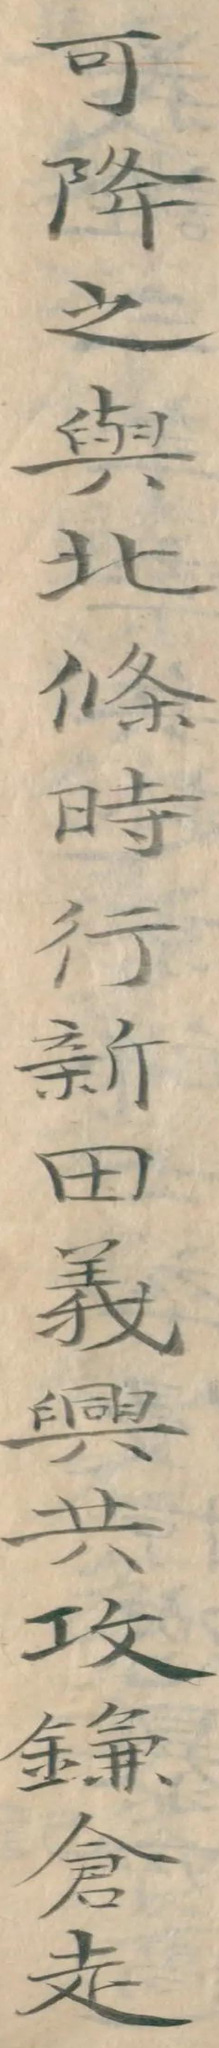可降之与北條時行新田義興共攻鎌倉走

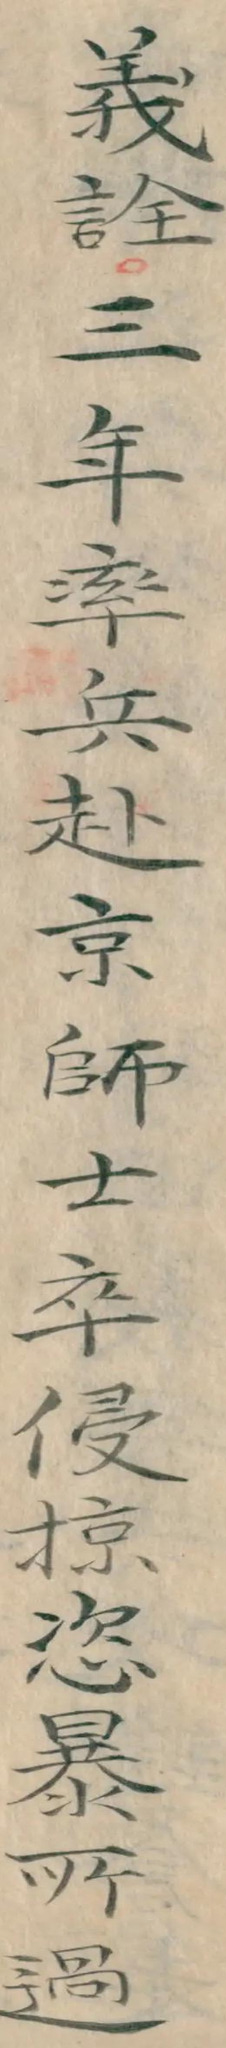義詮敗走三年率兵赴京師士卒侵掠恣暴所過
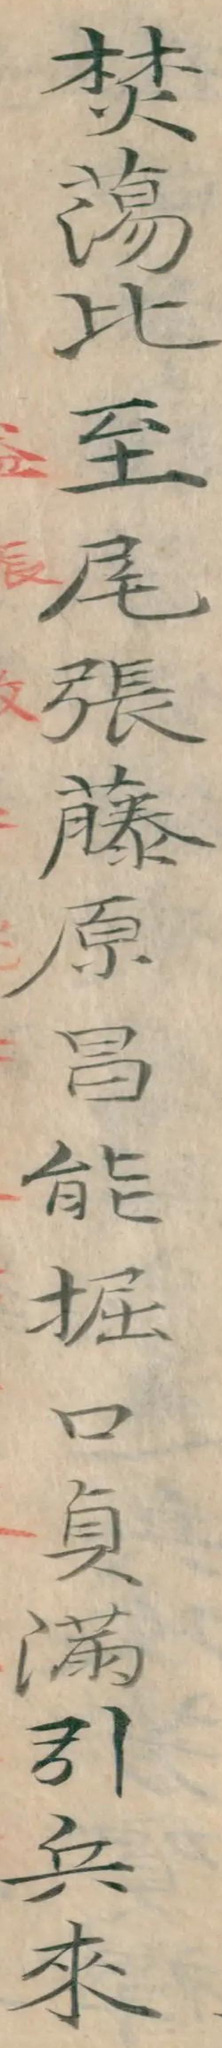焚蕩比至尾張藤原昌能掘口貞満引兵来
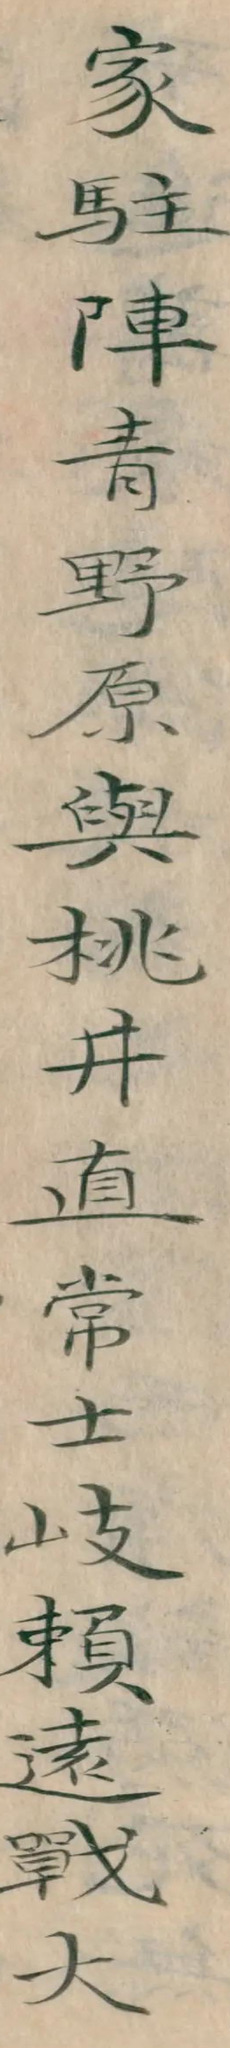家駐陣青野原与桃井直常士岐頼遠戦大
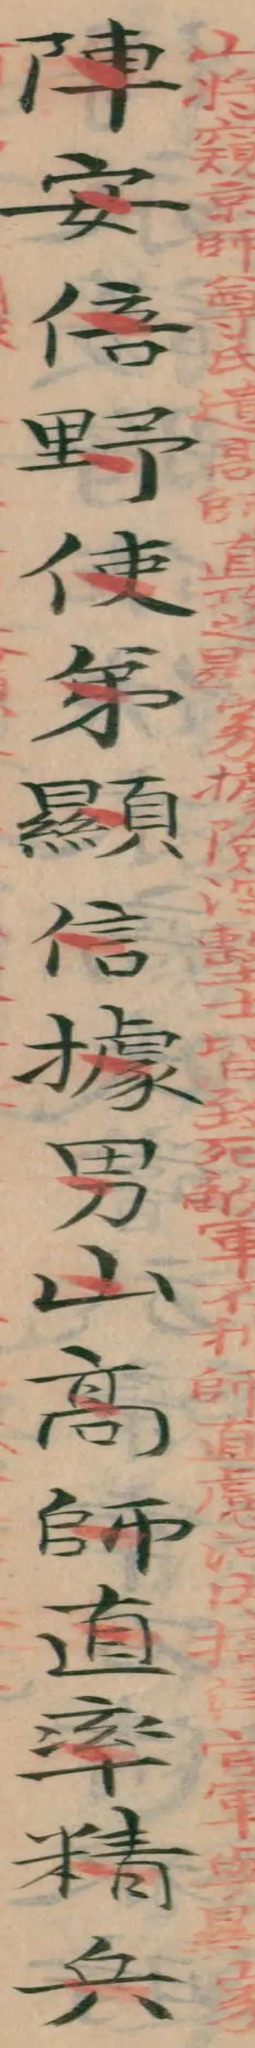陣安倍野使弟顕信拠男山高師直率精兵
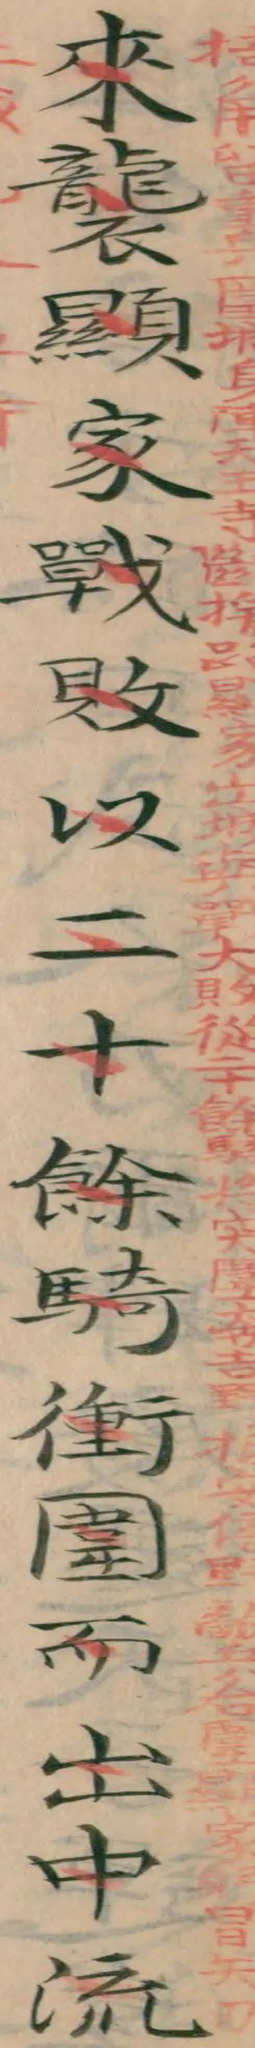来襲顕家戦敗以二十余騎衝囲而出中流
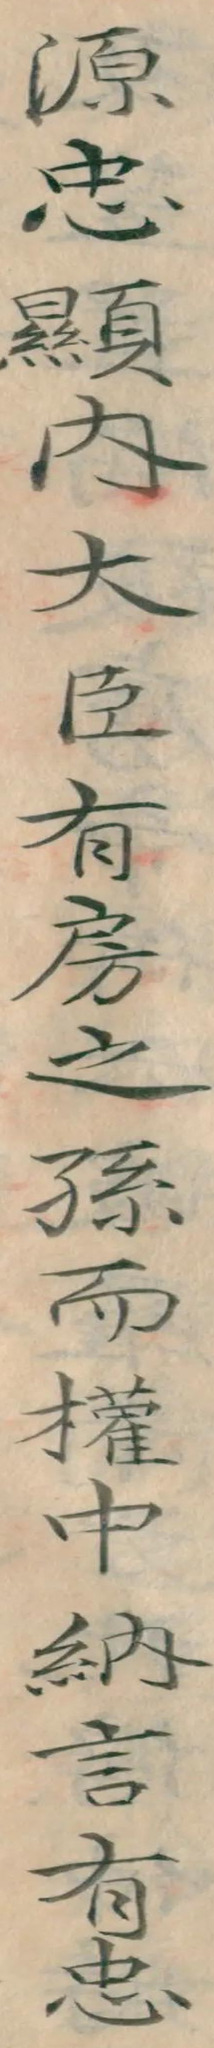源忠顕内大臣有房之孫而権中納言有忠

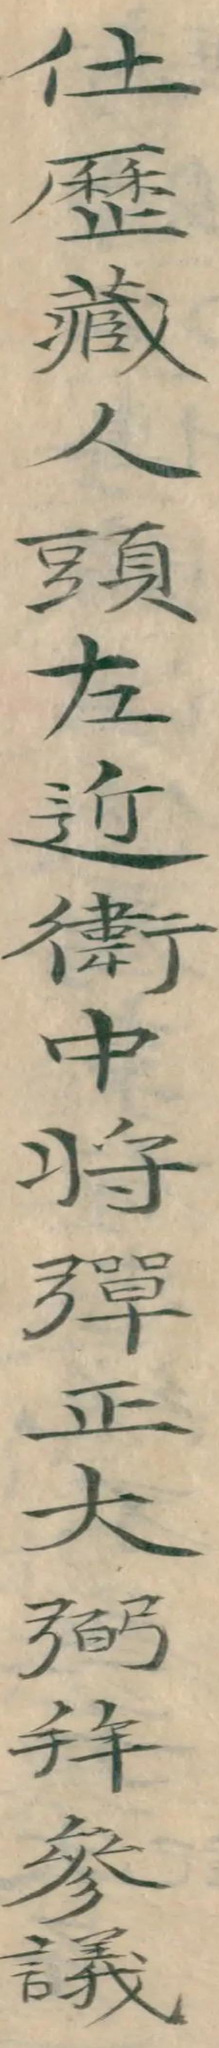仕歴蔵人頭左近衛中将弾正大弼拝参議
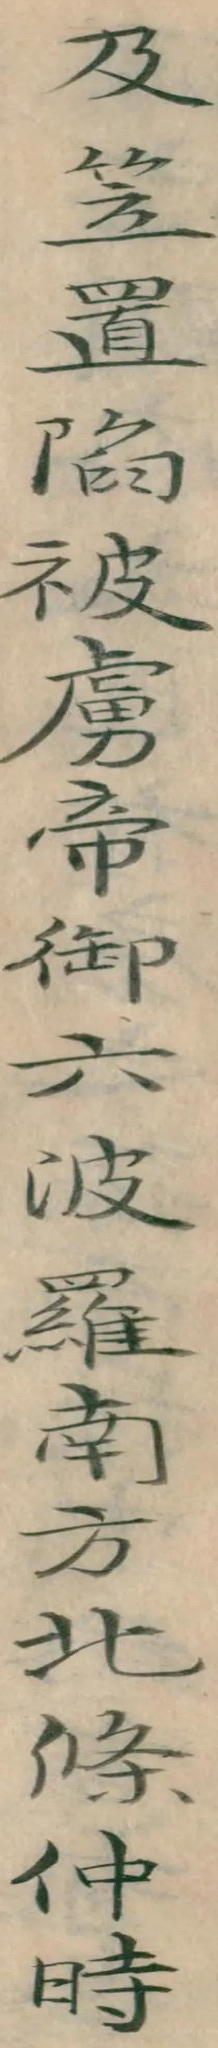及笠置陥被虜帝御六波羅南方北條仲時
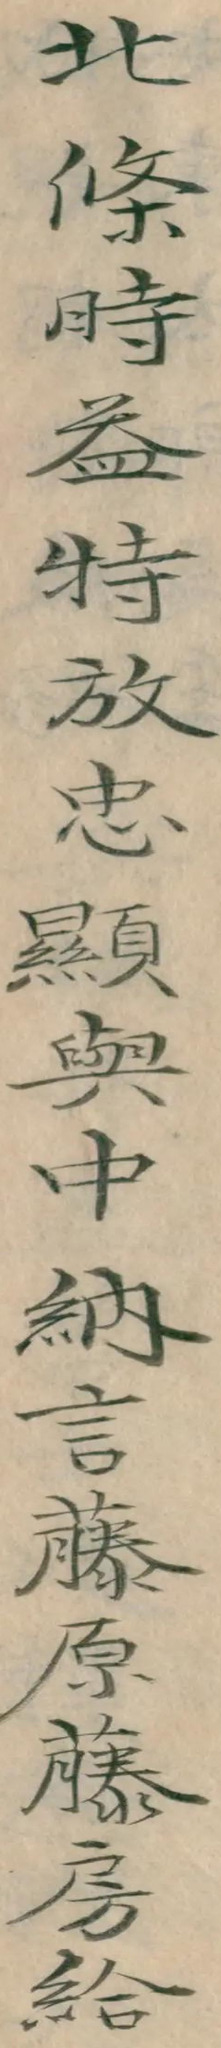北條時益特放忠顕与中納言藤原藤房給
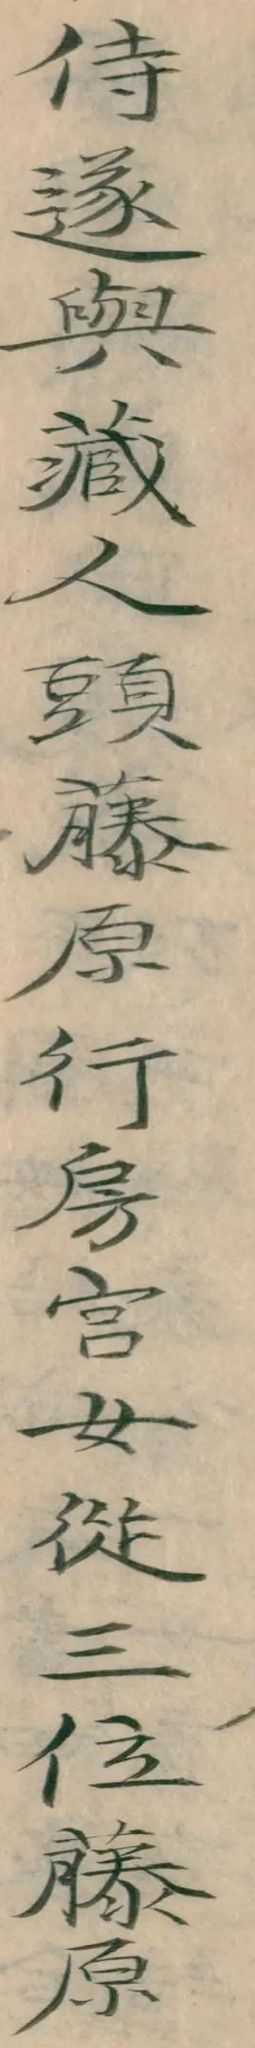侍遂与蔵人頭藤原行房宮女従三位藤原
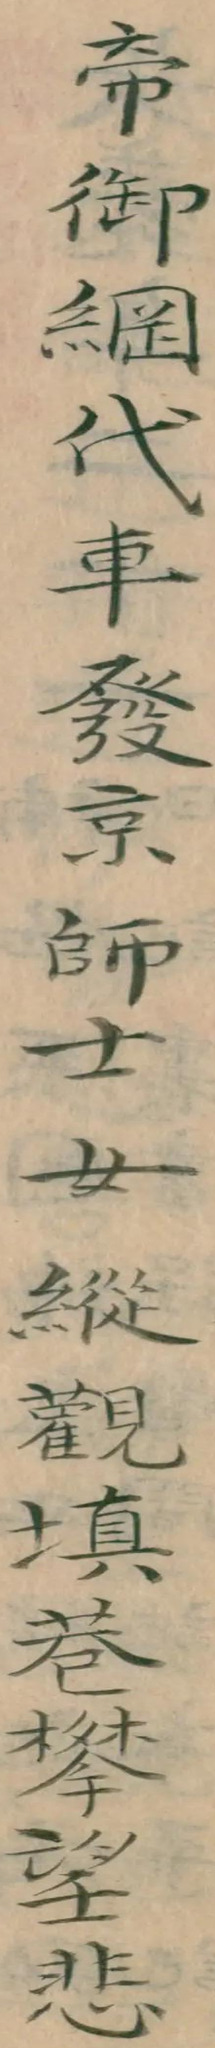帝御網代車発京師士女縦観填巷攀望悲
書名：輪池叢書. 12
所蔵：国立国会図書館 National Diet Library, JAPAN
